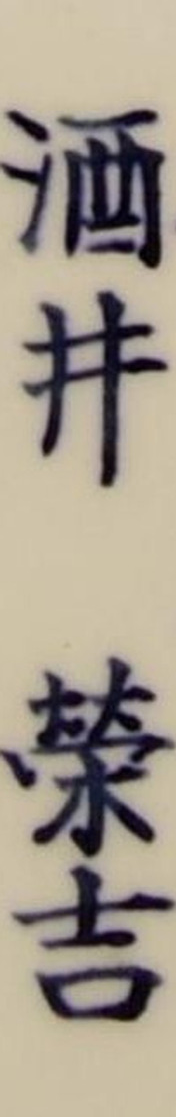酒井榮吉
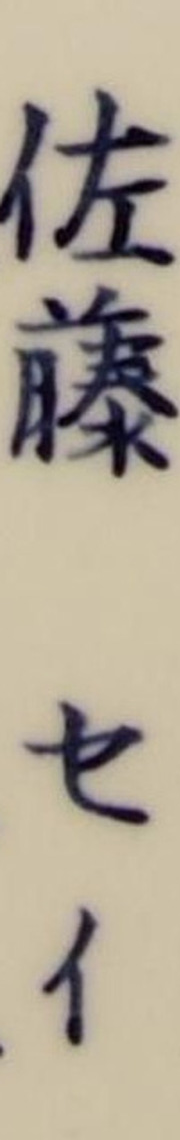佐藤セイ
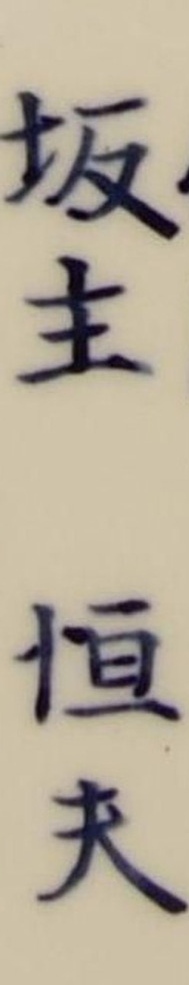坂主恒夫
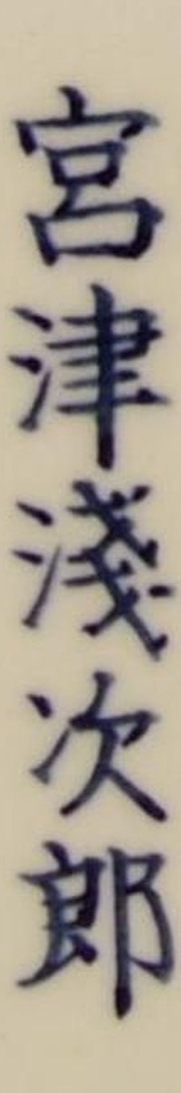宮津浅次郎
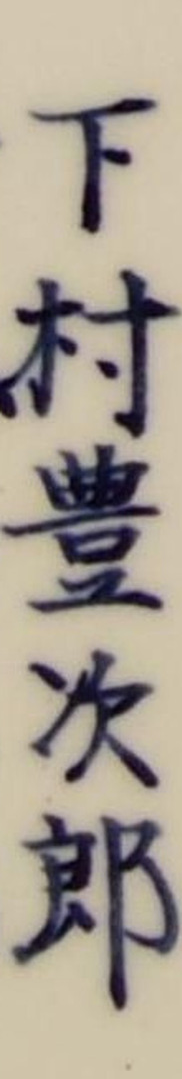下村豊次郎
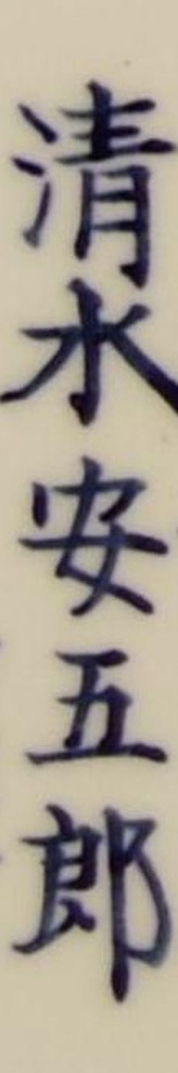清水安五郎
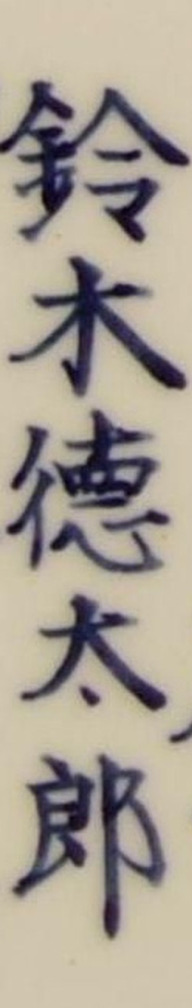鈴木徳太郎
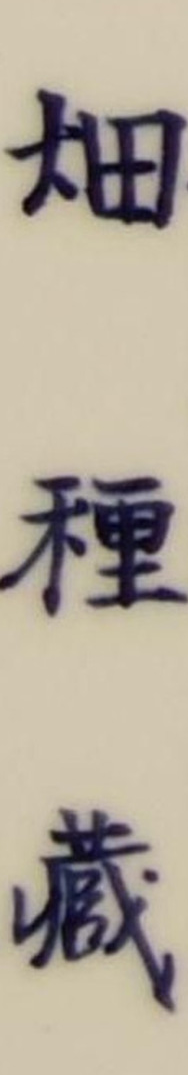畑種蔵
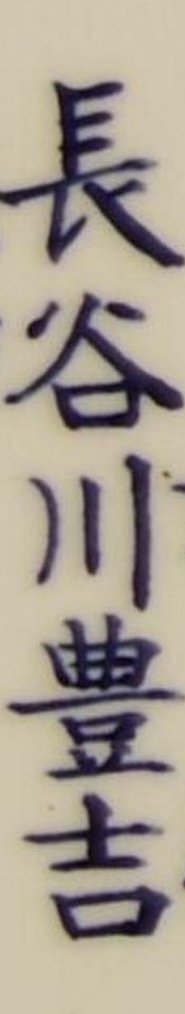長谷川豊吉
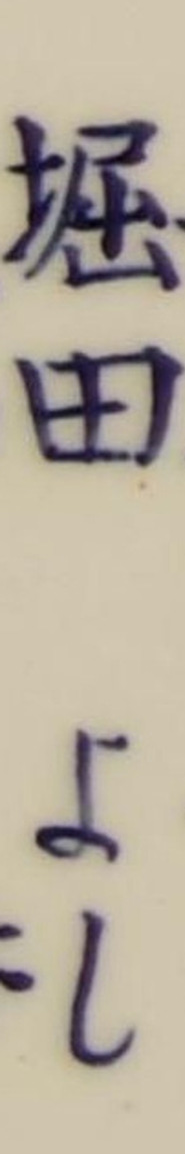堀田よし
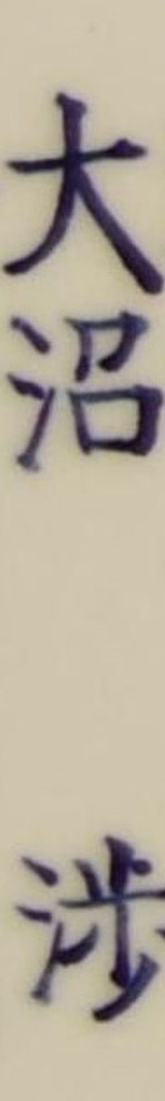大沼渉
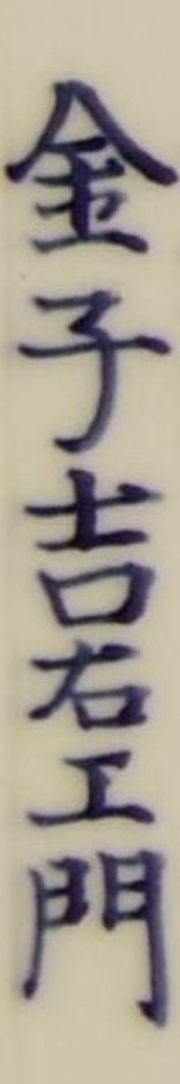金子吉右エ門

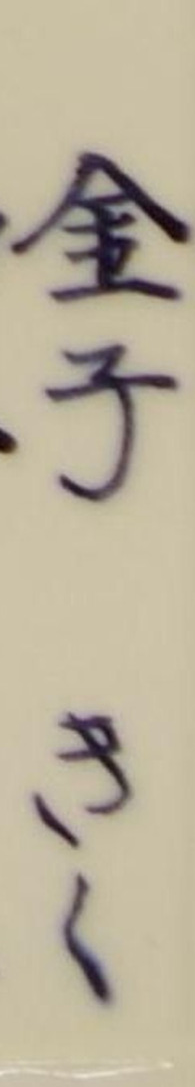金子きく
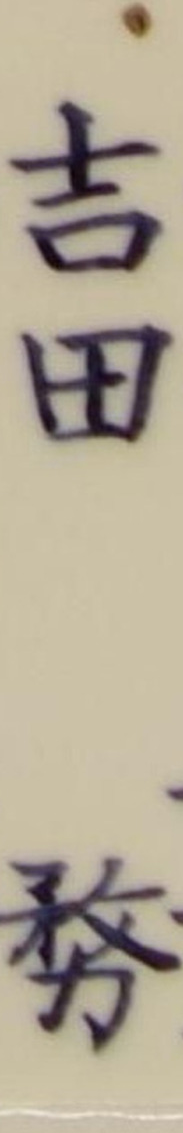吉田務
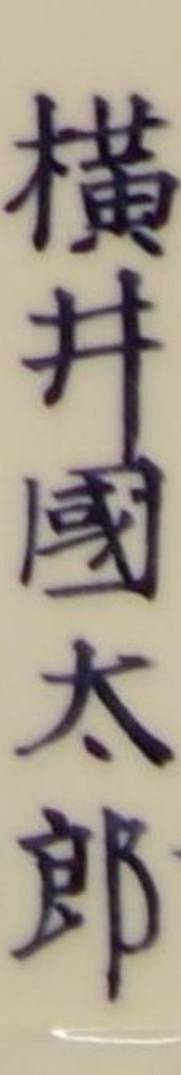横井國太郎
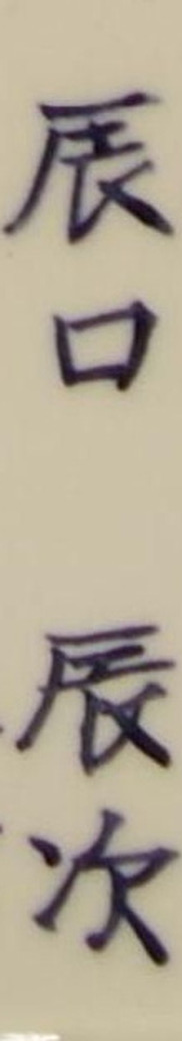辰口辰次
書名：A~D
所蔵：koyasan kongobuji
